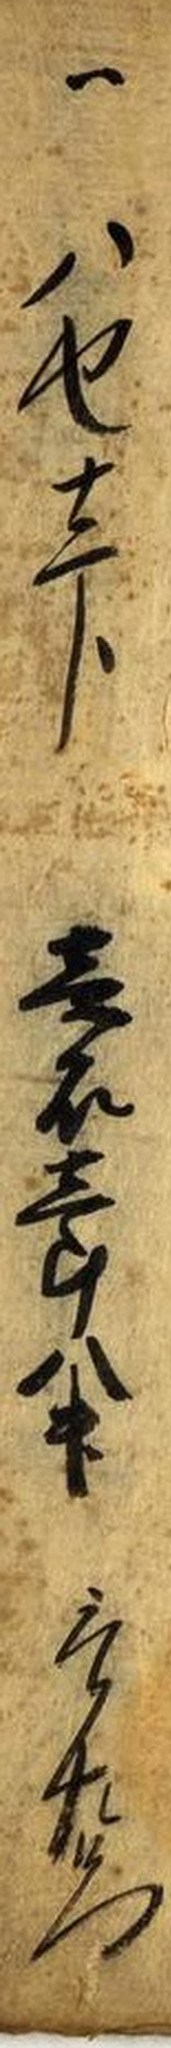同八セ十二分壱石壱斗八升三郎左衛門
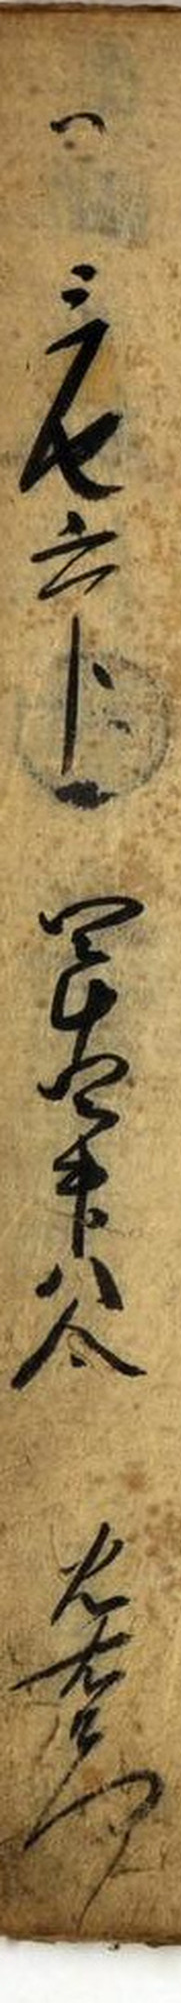同三セ六分四斗五升八合忠右衛門

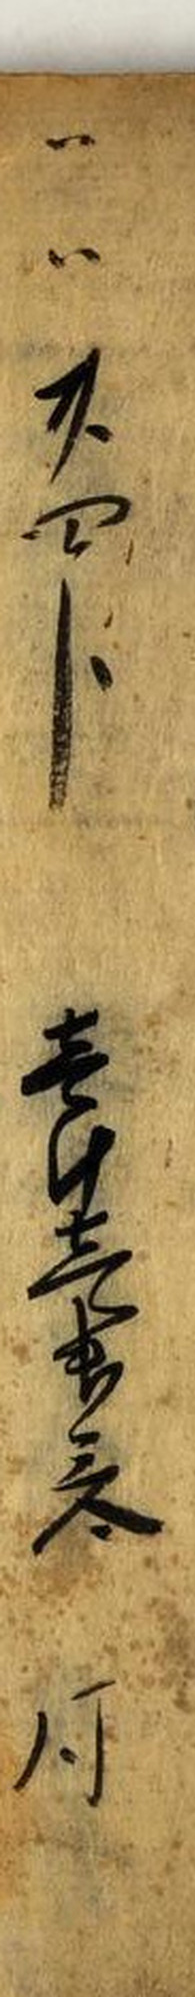同同廿四分壱斗壱升三合同
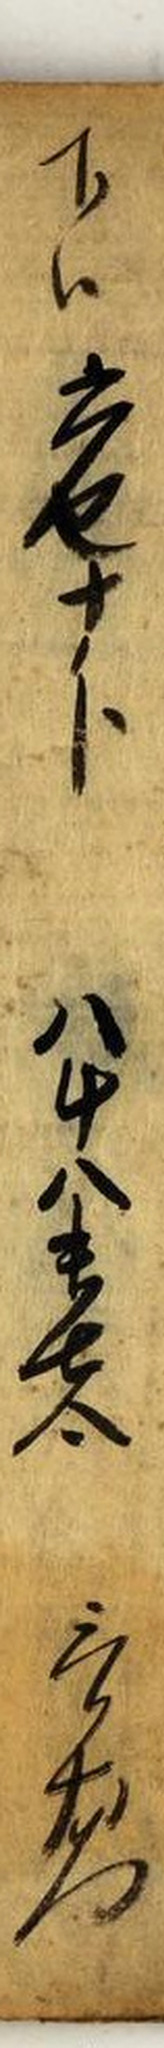下田六セ十分八斗八升七合三郎左衛門
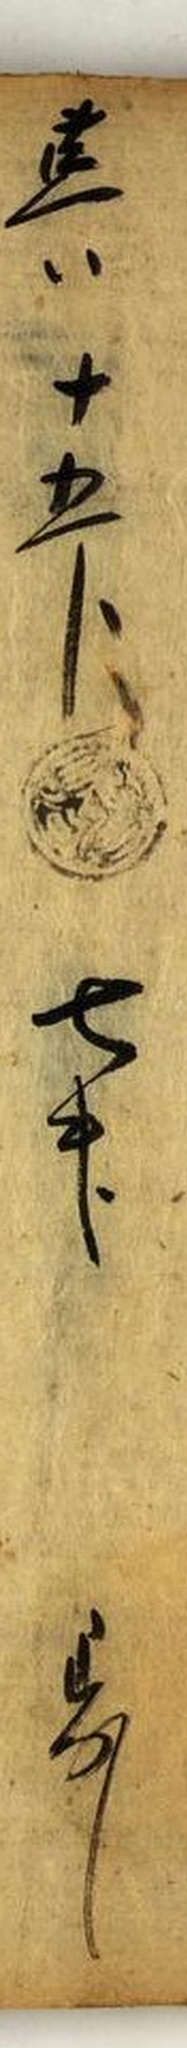荒同十五分㊞七升主なし
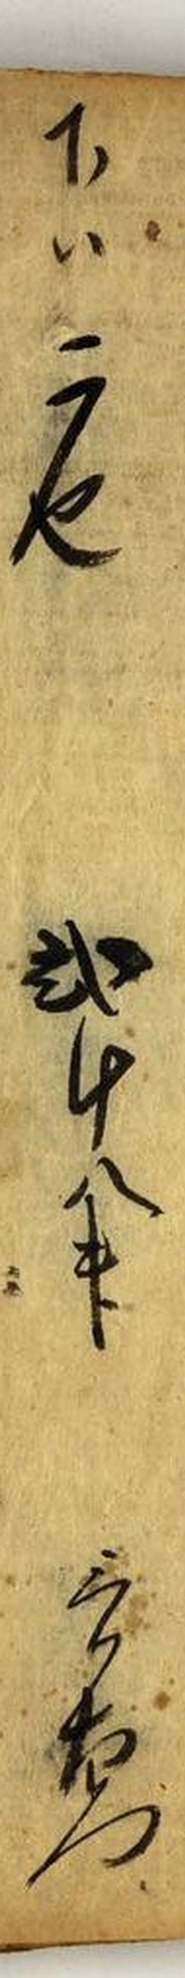下同二セ弐斗八升三郎左衛門
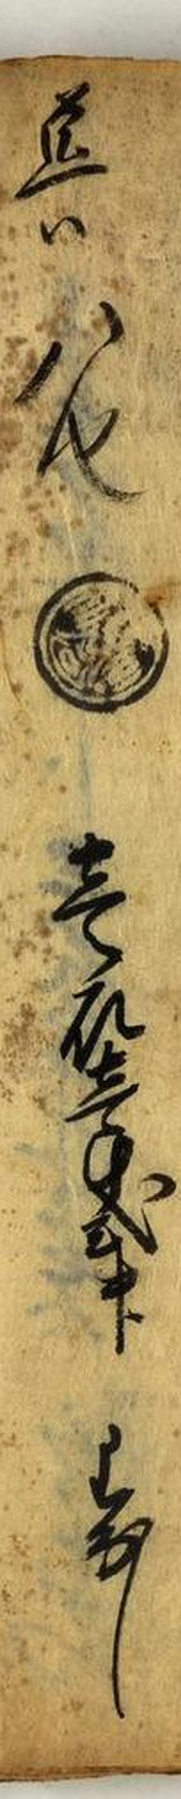荒同八セ㊞壱石壱斗弐升主なし
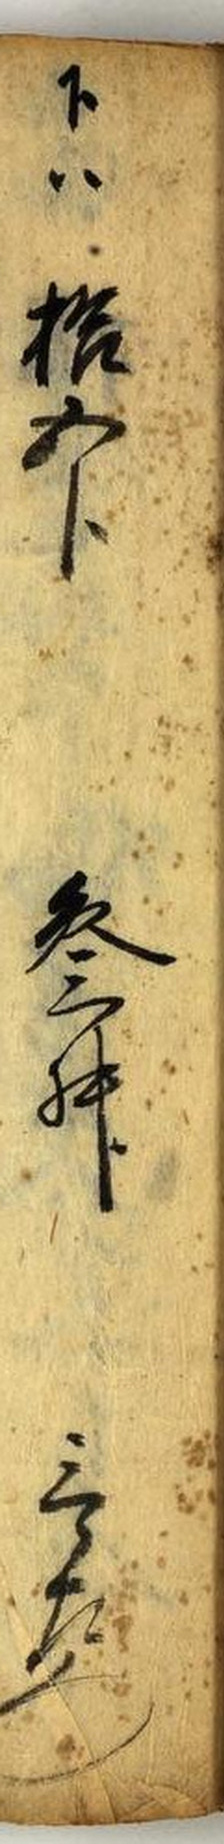下同拾五分参升三郎左衛門
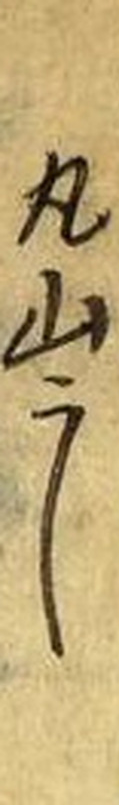丸山こし
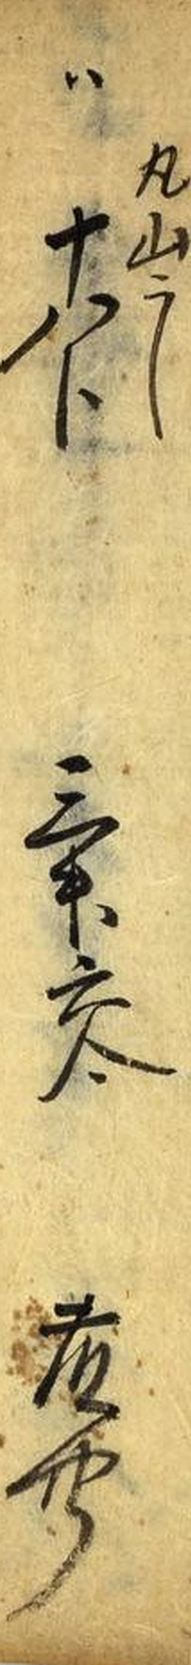同十八分三升六合藤四郎
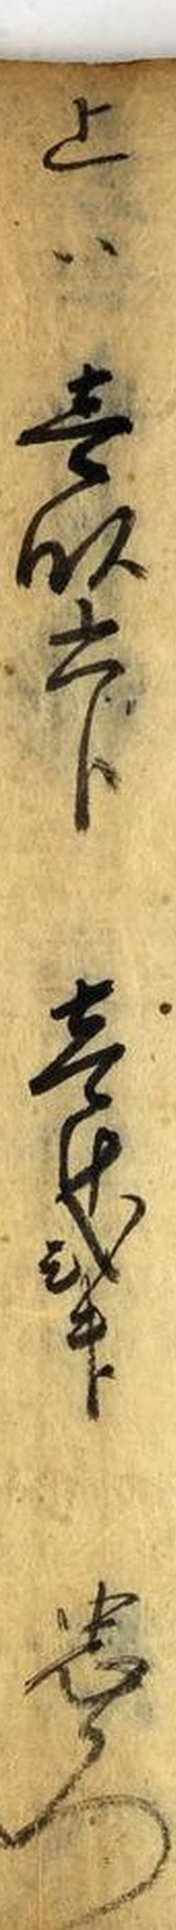上同壱畝六分壱斗弐升忠右衛門
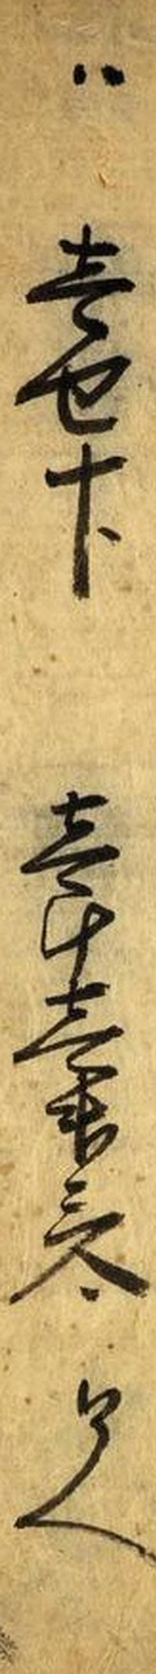同壱セ十分壱斗壱升三合同人
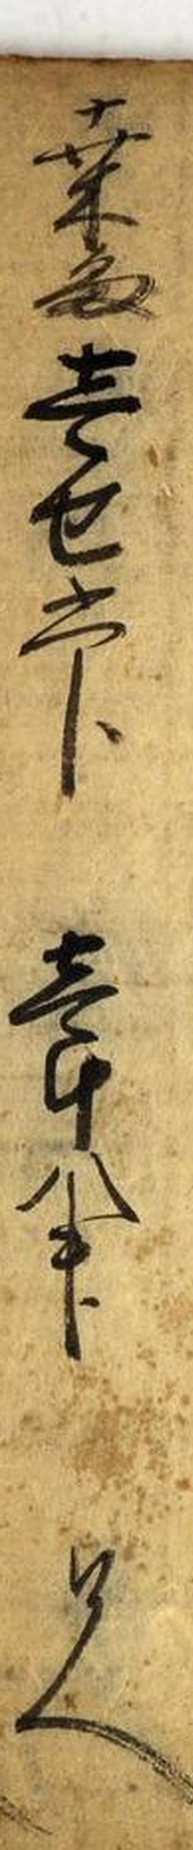桑畠壱セ六分壱斗八升同人
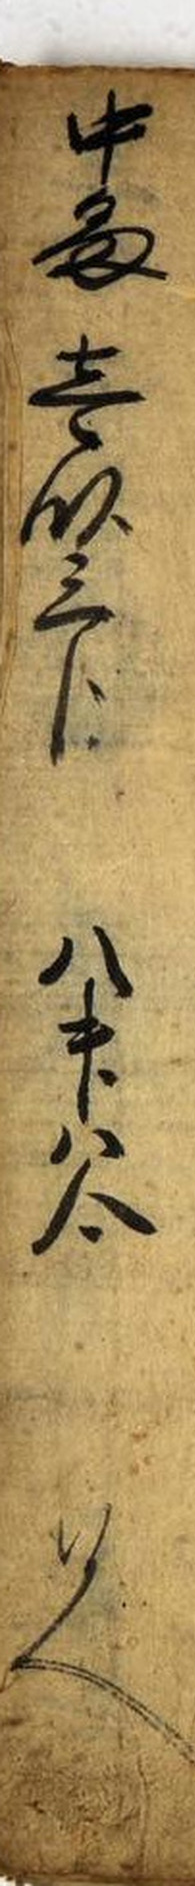中畠壱セ三分八升八合同人

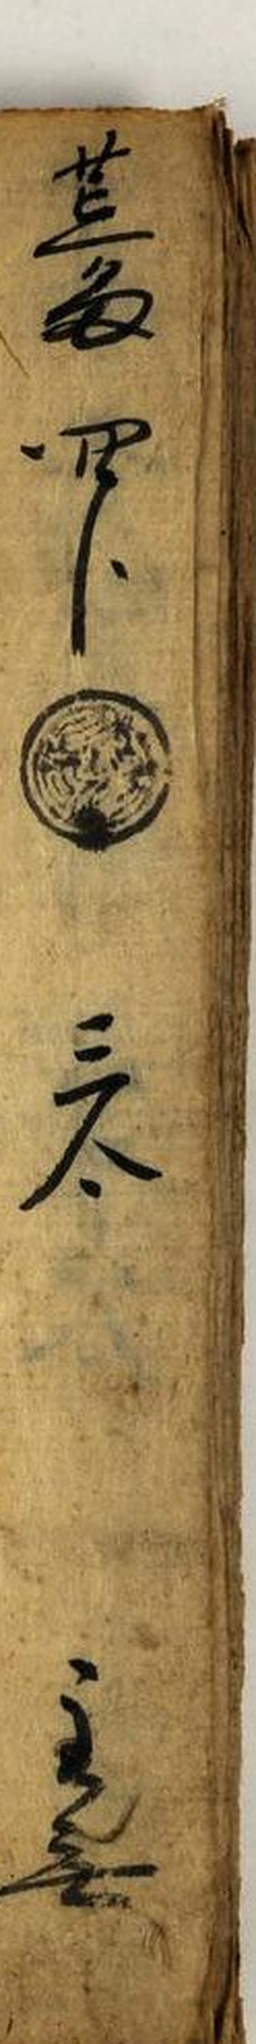荒畠四分㊞三合主無
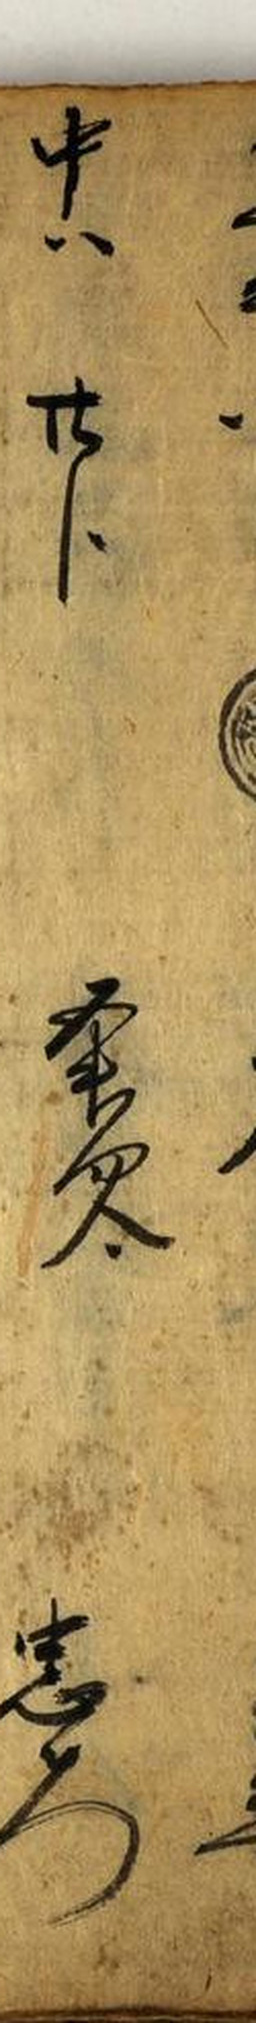中同廿分五升四合忠右衛門
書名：越前国西方内志津庄内本折村御検地帳
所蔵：福井県文書館 Fukui Prefectural Archives
